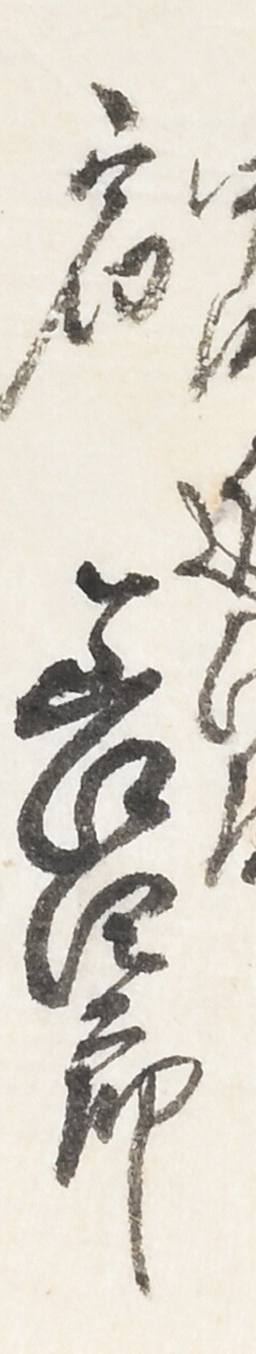宿善四郎
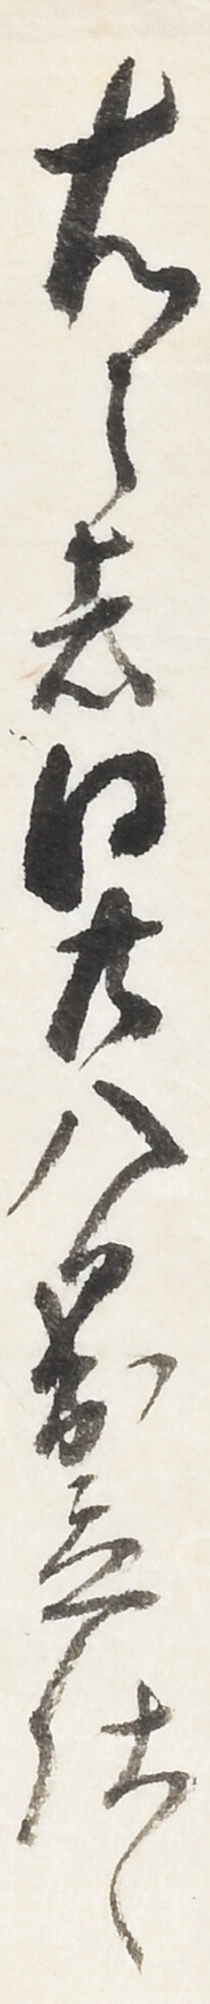右之者同廿八日出立仕候
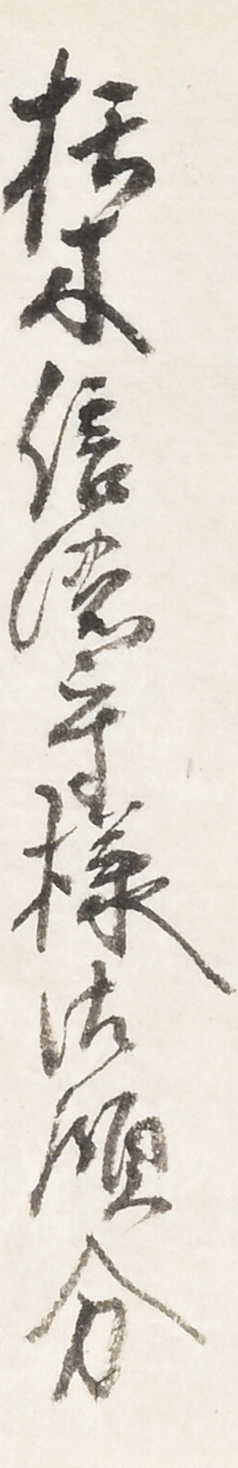朽木信濃守様御領分
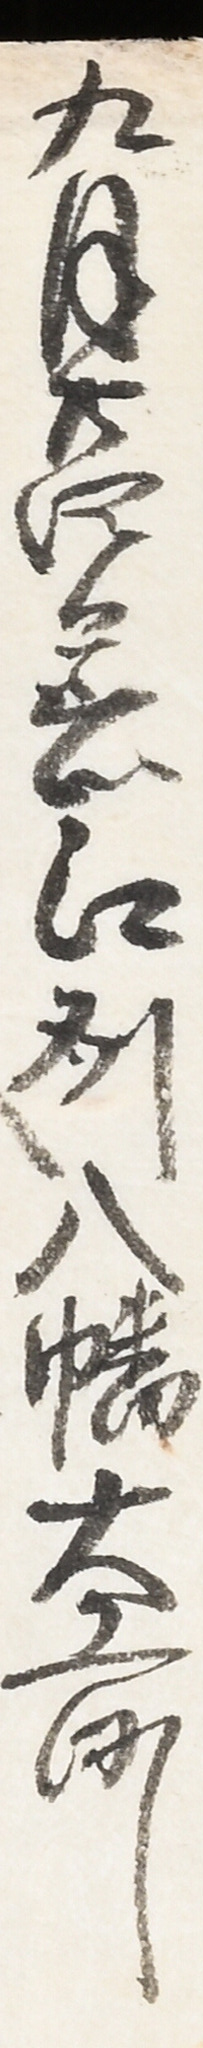九月二十四日着江州八幡大工町
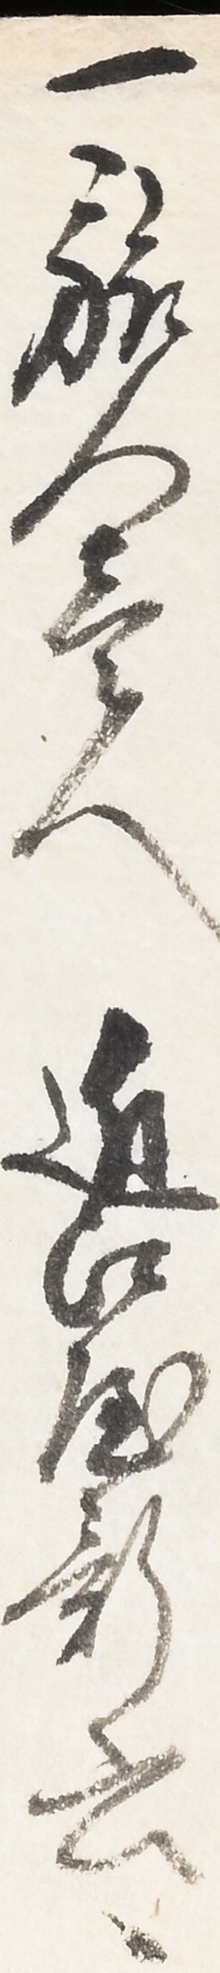一旅人壱人近江屋新六・
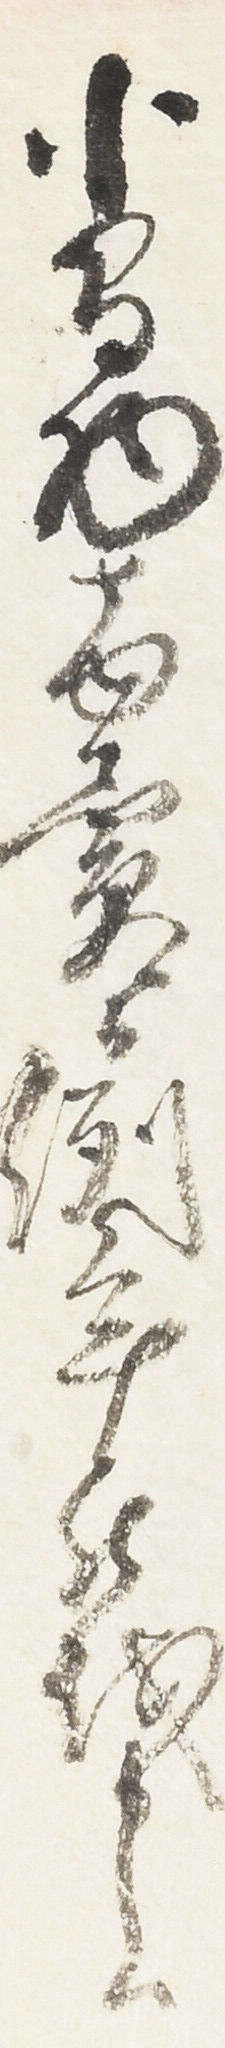小間物商売ニ而例年罷越申候
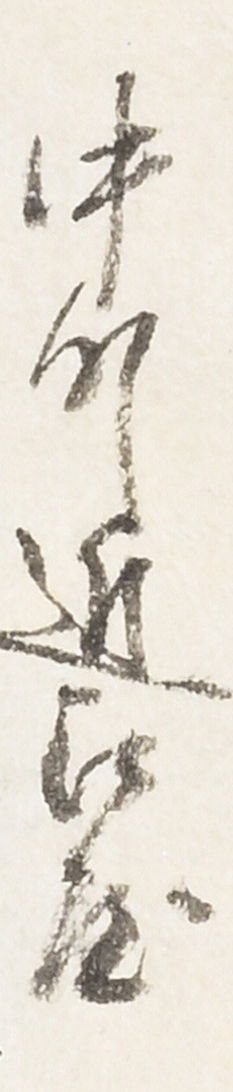中町近江屋
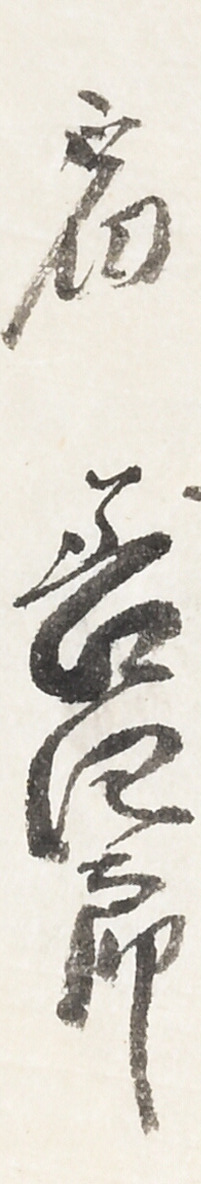宿善四郎
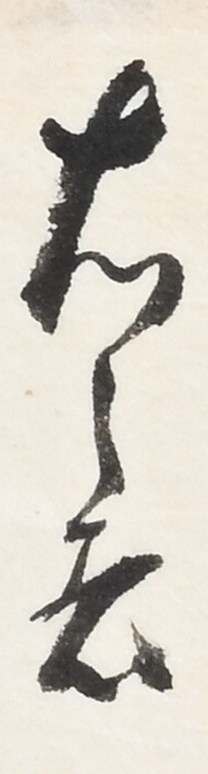右之者
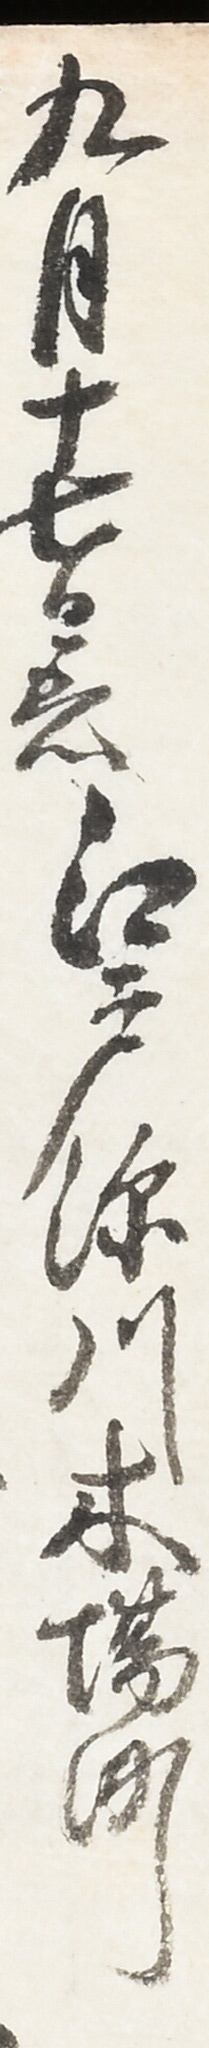九月十七日着江戸深川木場町
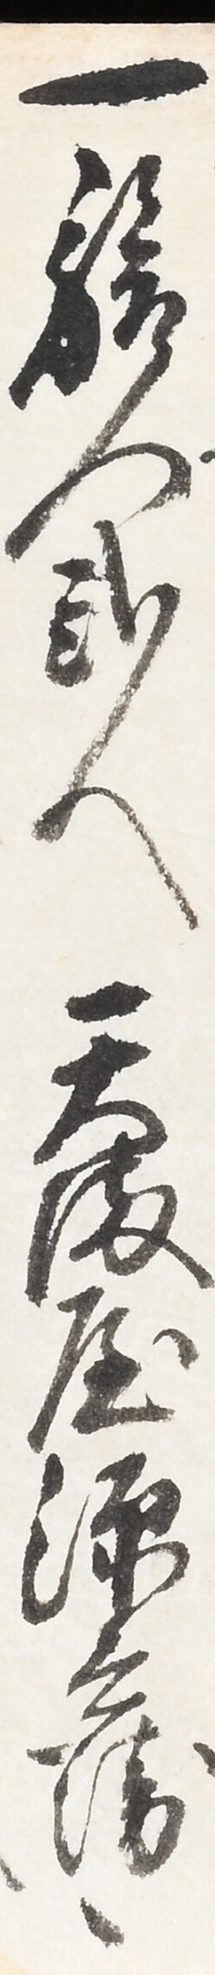一旅人弐人天満屋源兵衛・
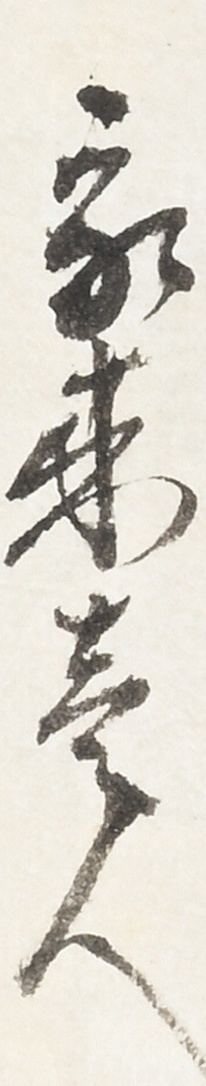家来壱人
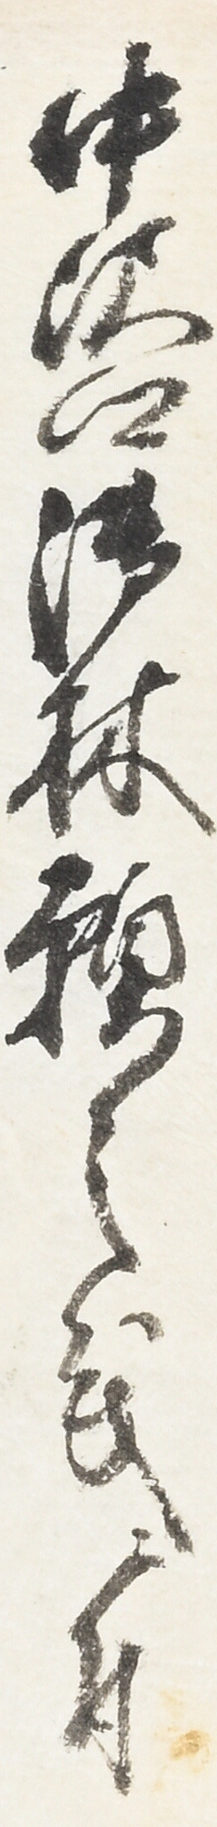中沢郷御林頼之義ニ付
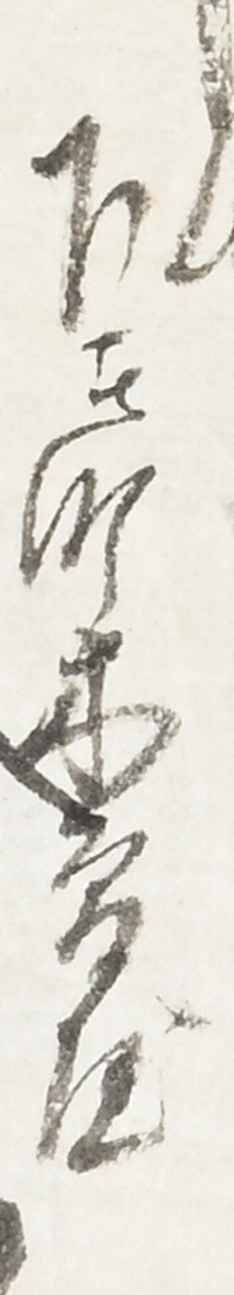下モ町木曽屋
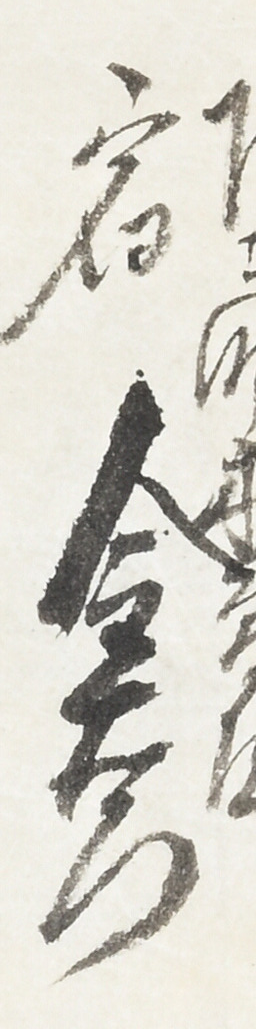宿金右衛門
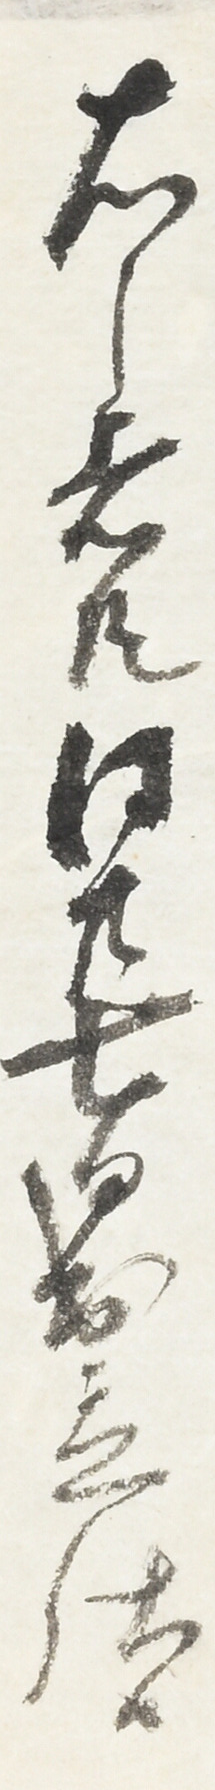右之者共同廿七日出立仕候
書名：旅人泊控帳
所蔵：伊那市立高遠町図書館・合同会社AMANE
